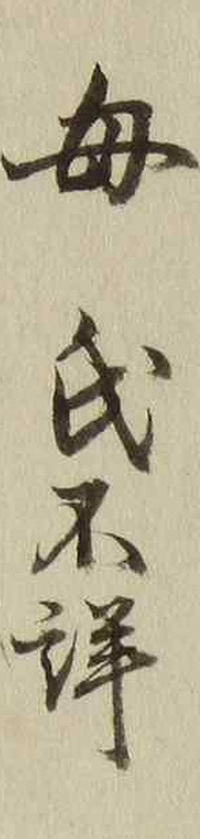母氏不詳
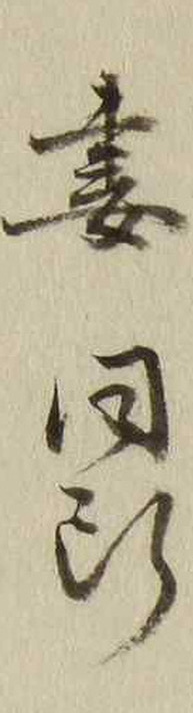妻同断

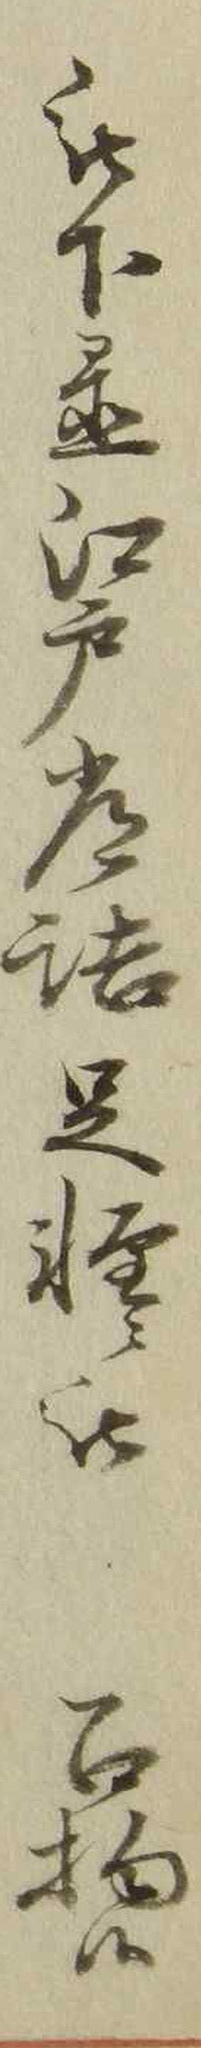被下置江戸常詰足軽ニ被召抱候
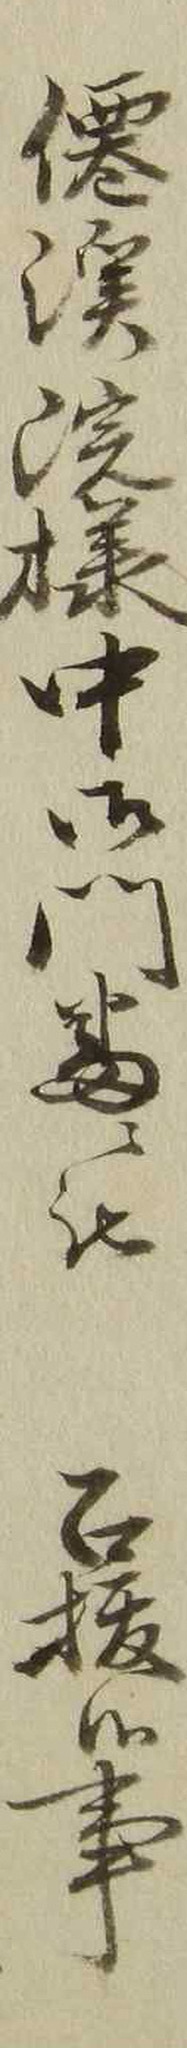僊渓院様中御門番ニ被召抜候事
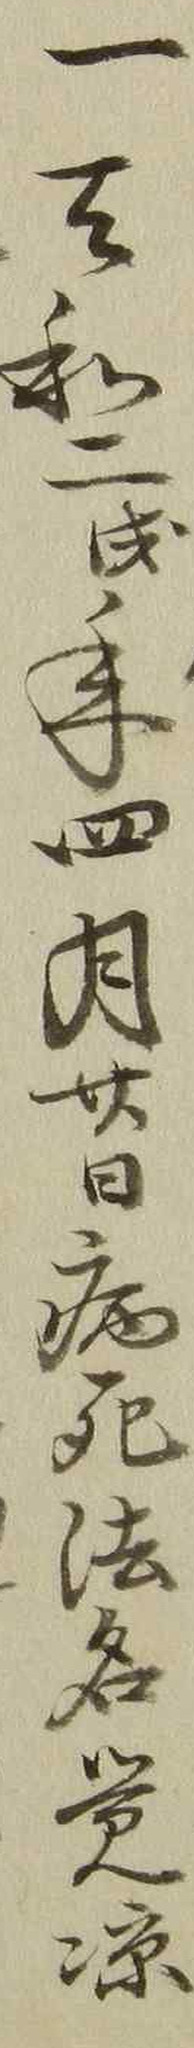一天和二戌年四月廿日病死法名覚涼
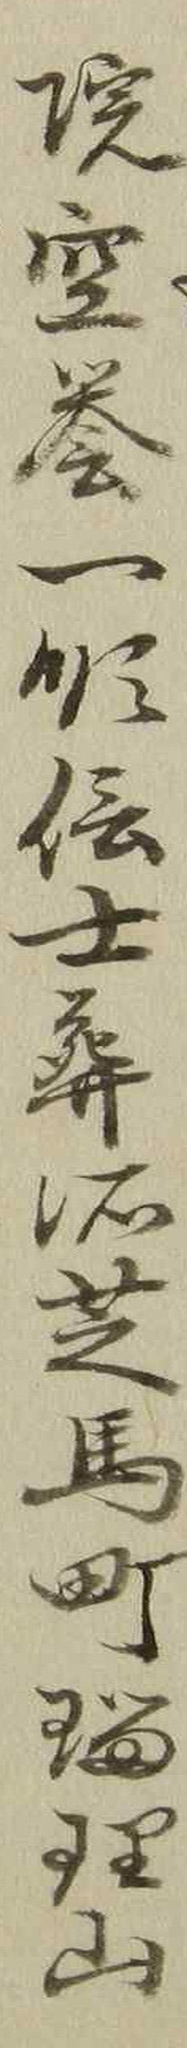院空誉一順信士葬所芝馬町瑞理山
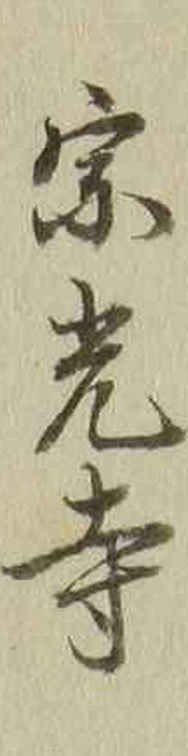宗光寺
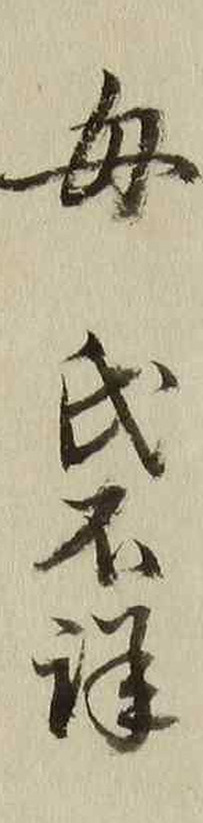母氏不詳
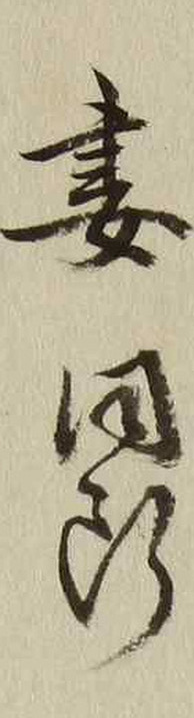妻同断
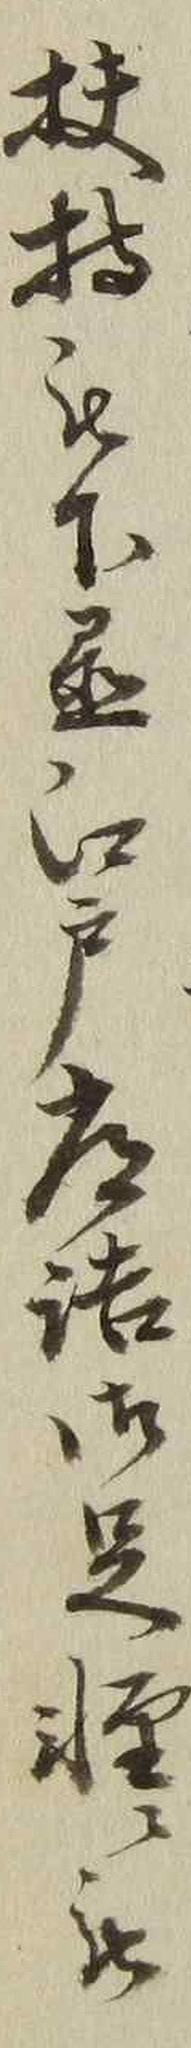扶持被下置江戸常詰御足軽ニ被
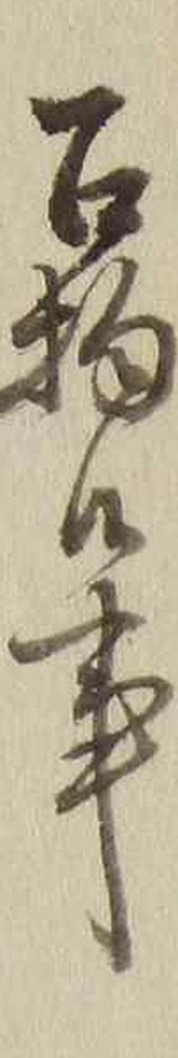召抱候事
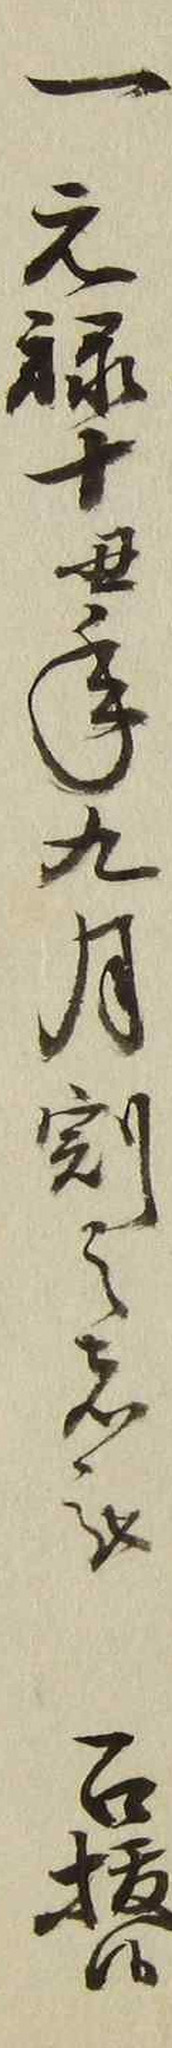一元禄十丑年九月割之者被召抜候
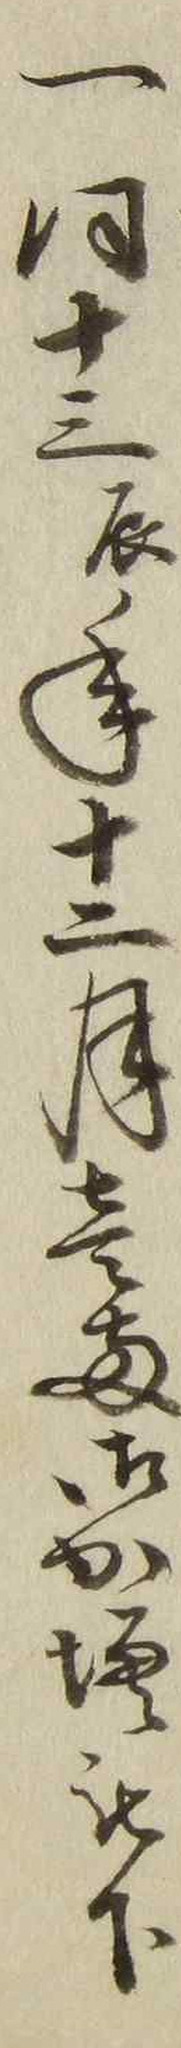一同十三辰年十二月壱両御加増被下

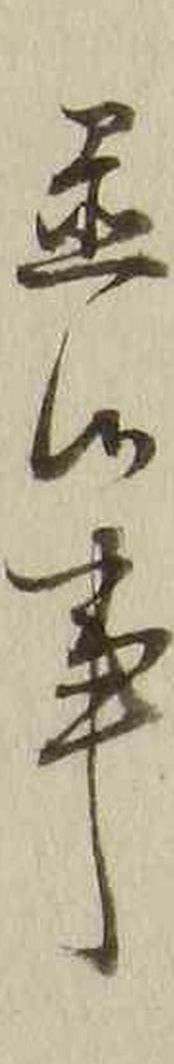置候事
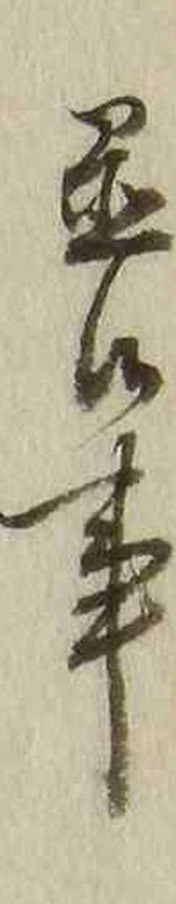置候事
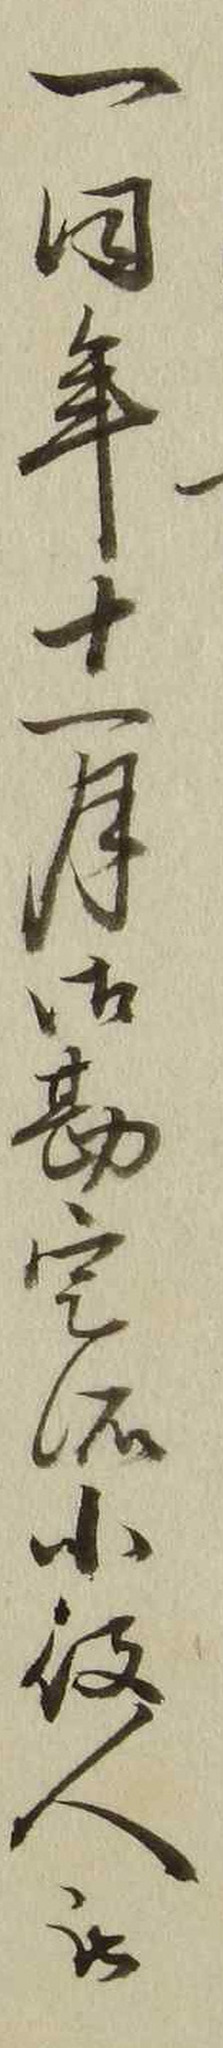一同年十一月御勘定所小役人被
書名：諸士系譜　巻之53　に之部4
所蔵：会津若松市立会津図書館
